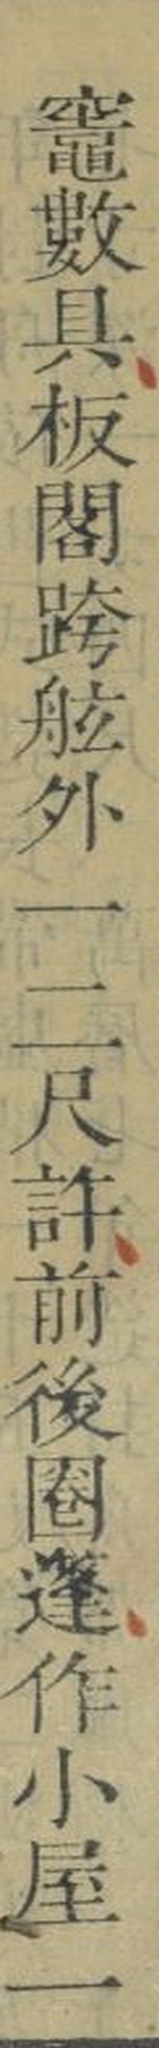竈數具板閣跨舷外一二尺許前後圈篷作小屋一
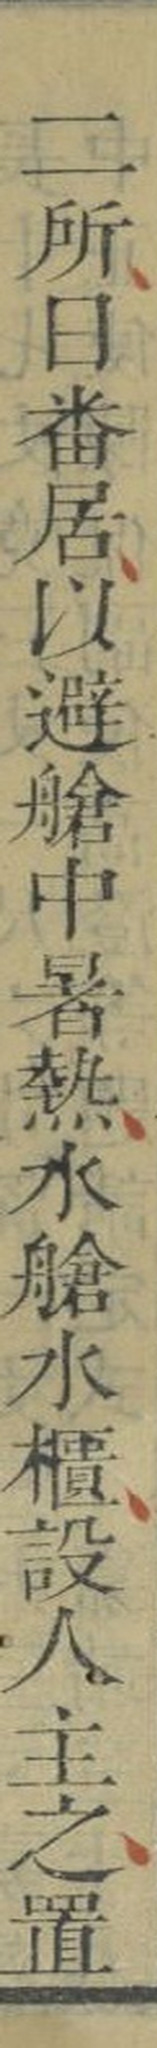二所日畨居以避艙中暑𤍠水艙水櫃設人主之置
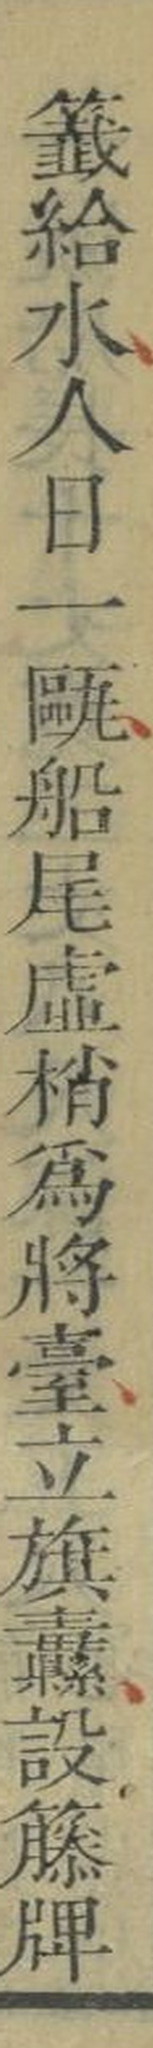籖給水人日一甌船尾虚梢爲將臺立旗纛設籐牌
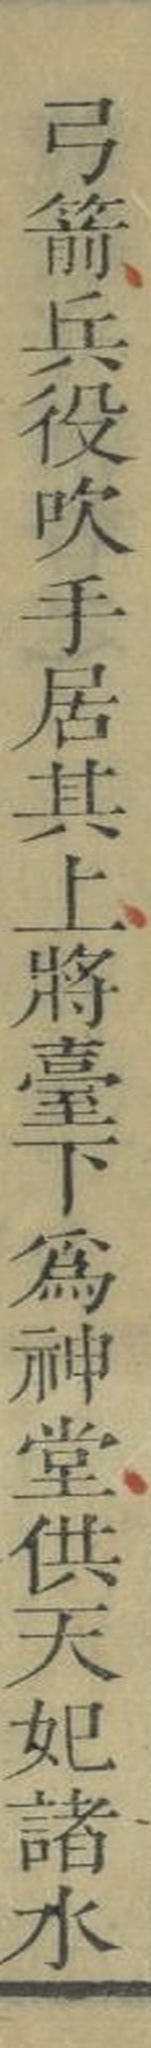弓箭兵役吹手居其上將臺下爲神堂供天妃諸水
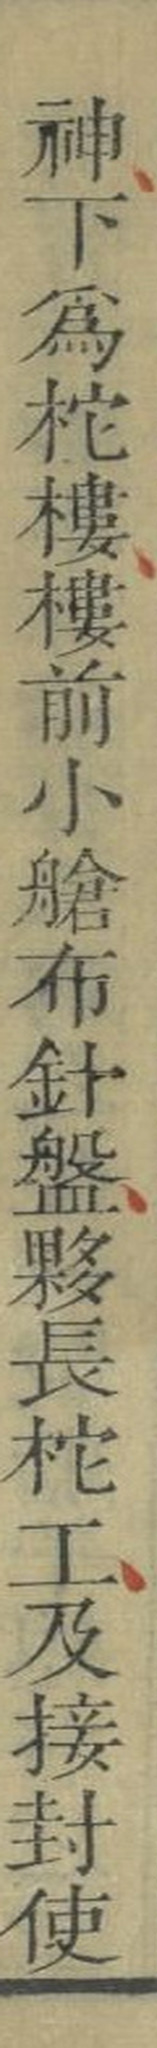神下爲柁樓樓前小艙布針盤夥長柁工及接封使
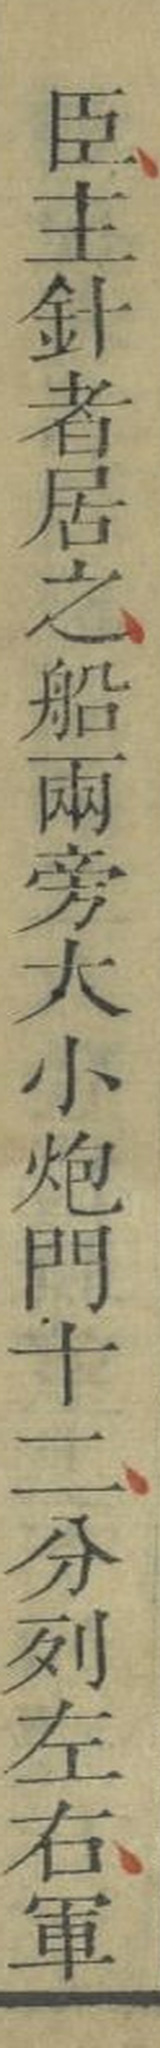臣主針者居之船兩旁大小炮門十二分列左右軍
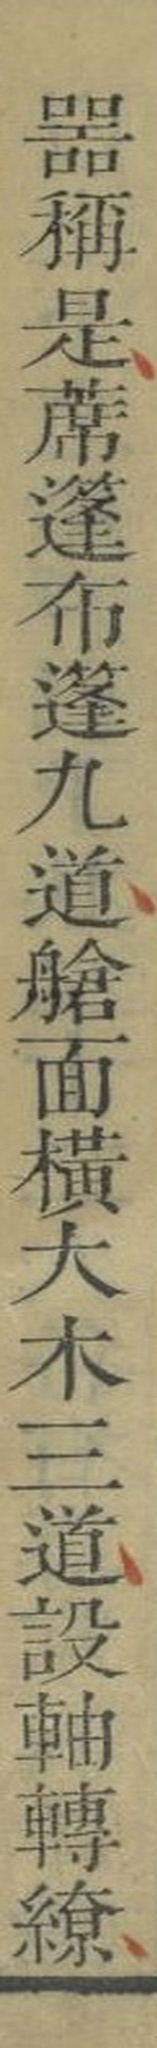噐稱是蓆篷布篷九道艙面橫大木三道設軸轉繚

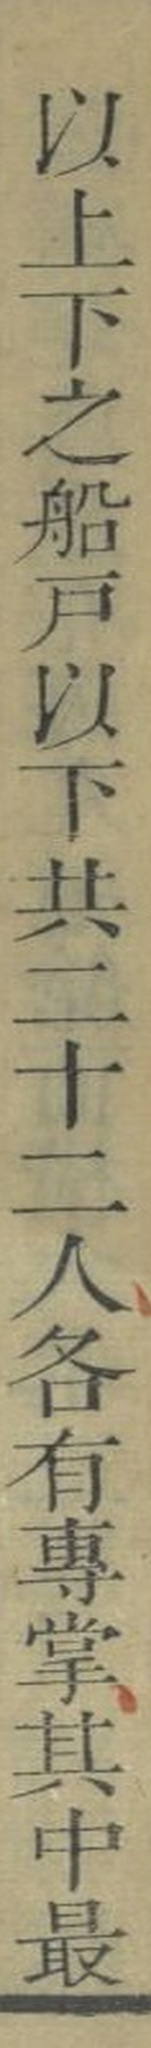以上下之船戸以下共二十二人各有專掌其中最
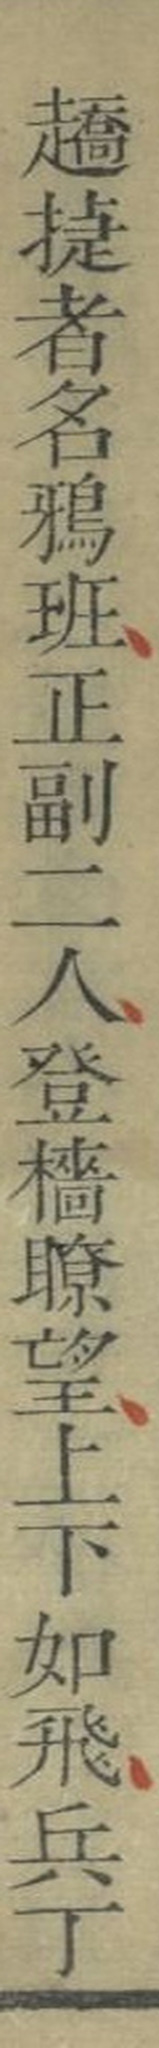趫㨗者名鴉班正副二人登檣瞭望上下如飛兵丁
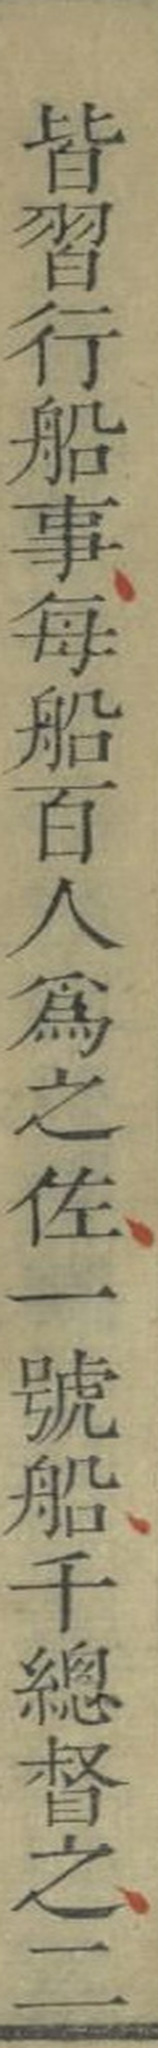皆習行船事每船百人爲之佐一號船千總督之二
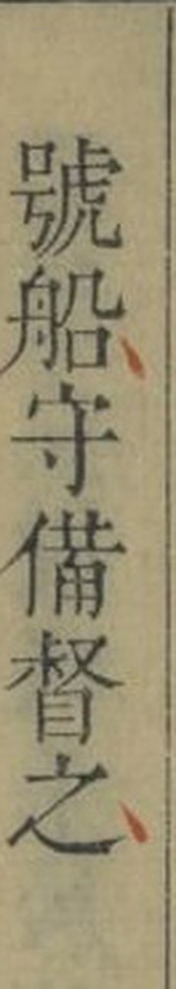號船守備督之
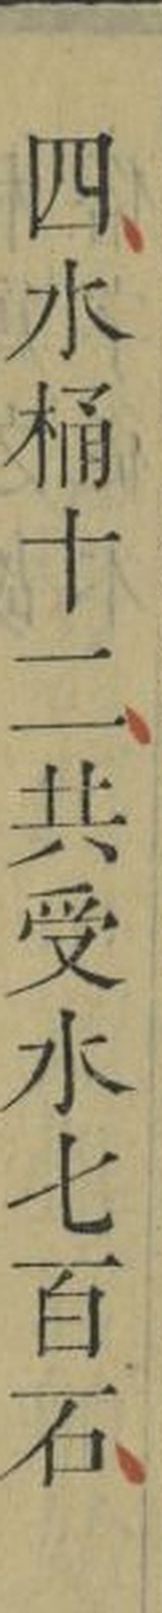四水桶十二共受水七百石
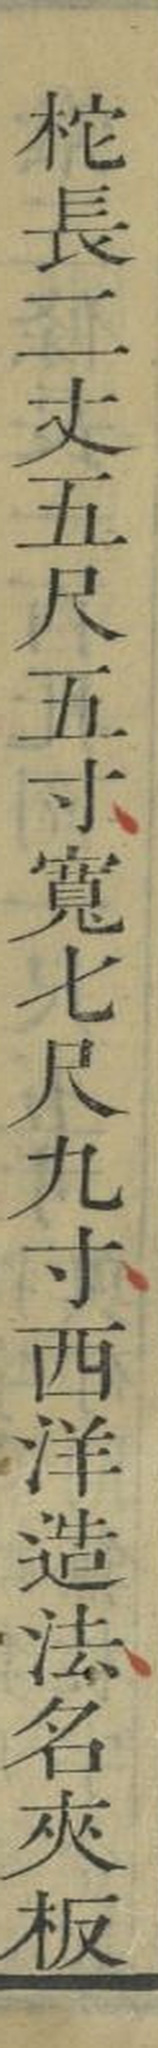柁長二丈五尺五寸寬七尺九寸西洋造法名夾板
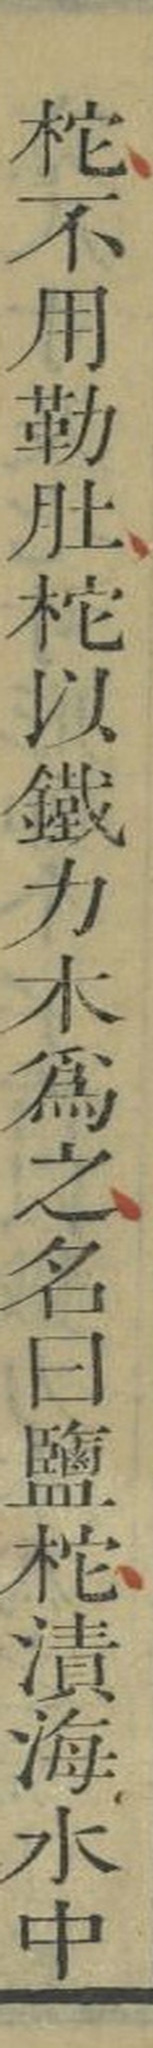柁不用勒肚柁以鐵力木爲之名曰鹽柁漬海水中

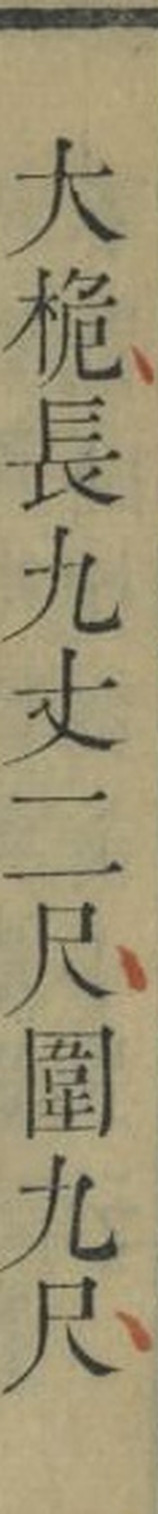大桅長九丈二尺圍九尺
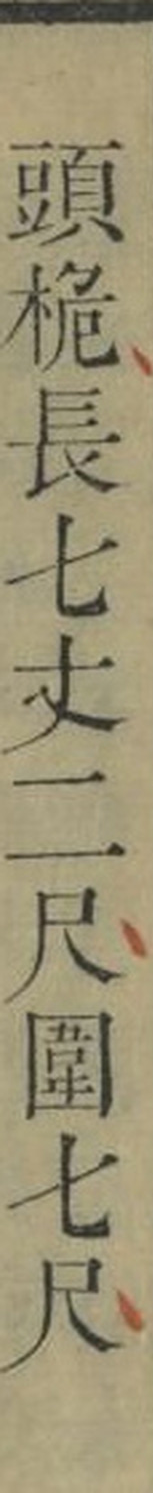頭桅長七丈二尺圍七尺
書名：中山伝信録 巻一、巻二
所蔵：University of the Ryukyus Library
